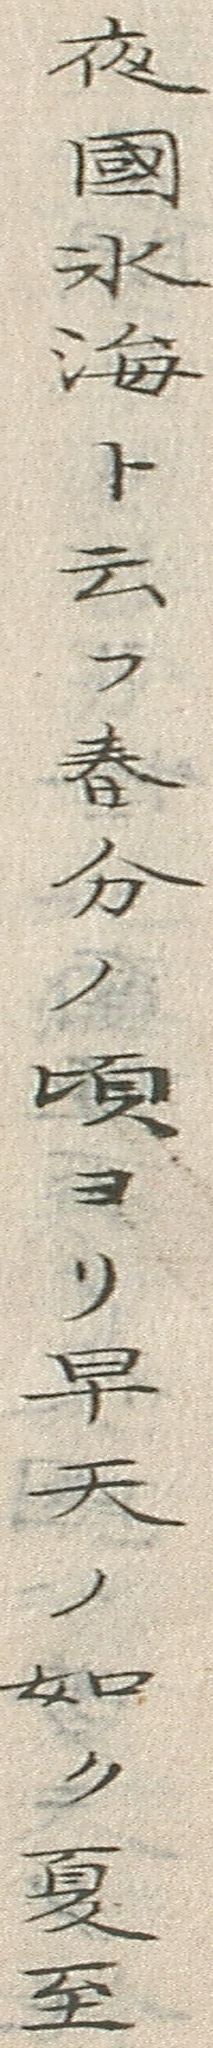夜国氷海ト云フ春分ノ頃ヨリ早天ノ如ク夏至
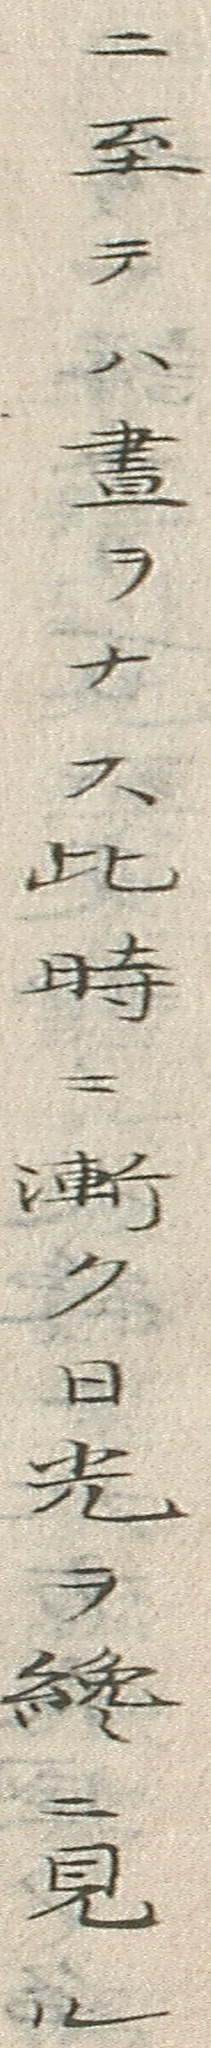ニ至テハ昼ヲナス此時ニ漸ク日光ヲ僅ニ見ル
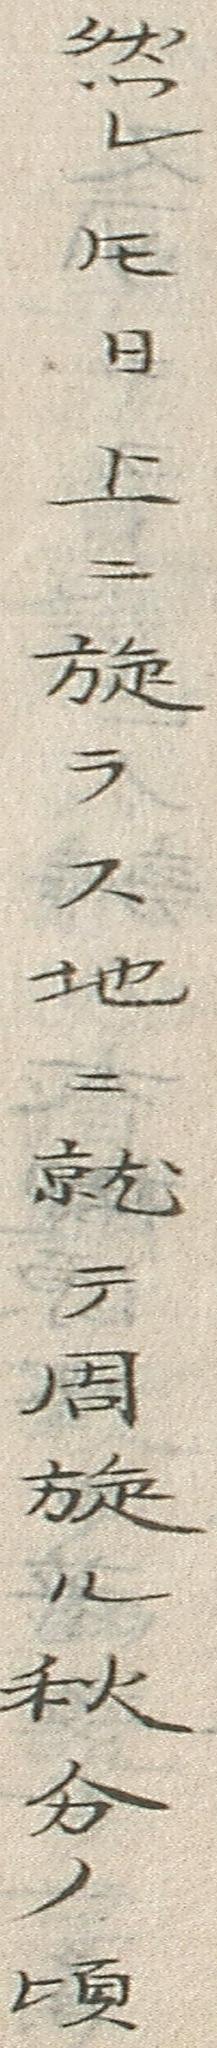然レトモ日上ニ旋ラス地ニ就テ周旋ル秋分ノ頃
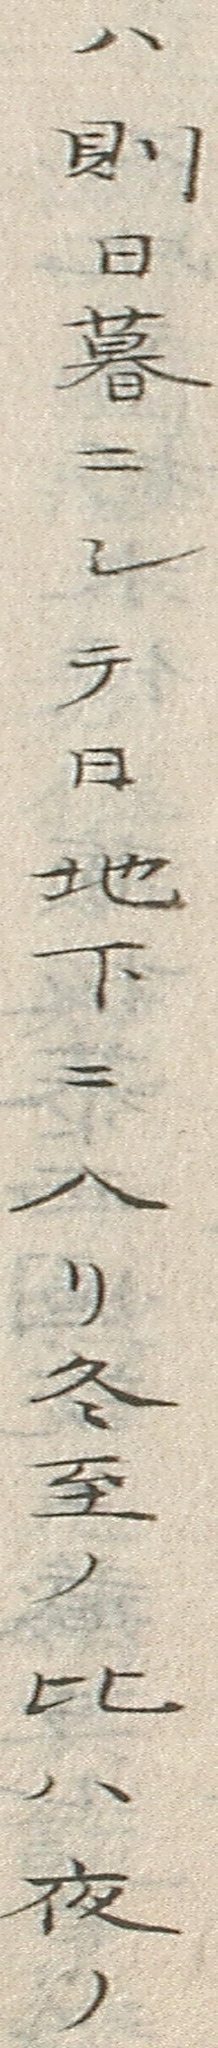ハ則日暮ニシテ日地下ニ入リ冬至ノ比ハ夜ノ
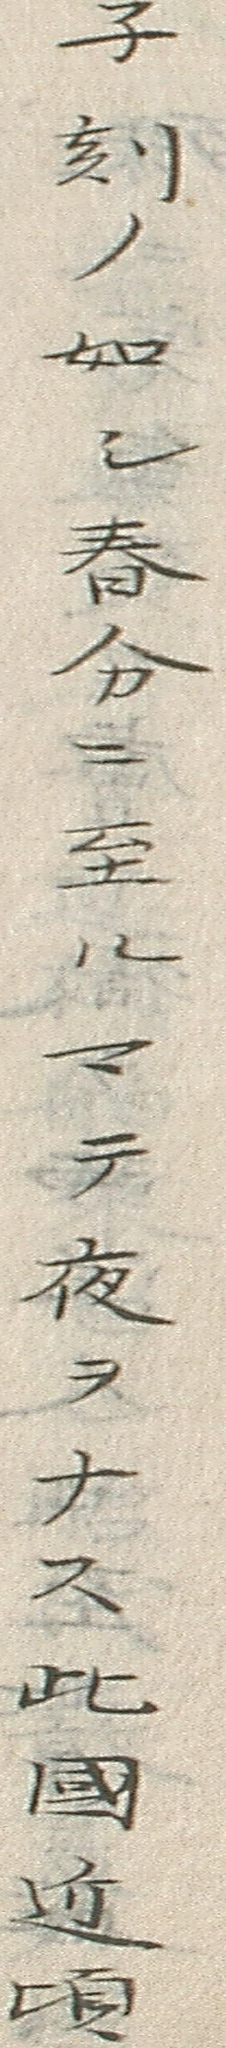子刻ノ如シ春分ニ至ルマテ夜ヲナス此国近頃
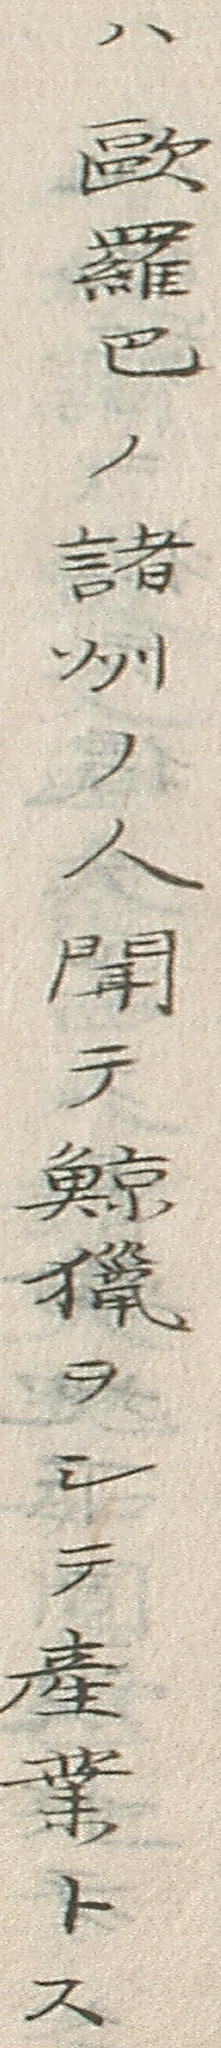ハ欧羅巴ノ諸州ノ人聞テ鯨獵ヲシテ産業トス
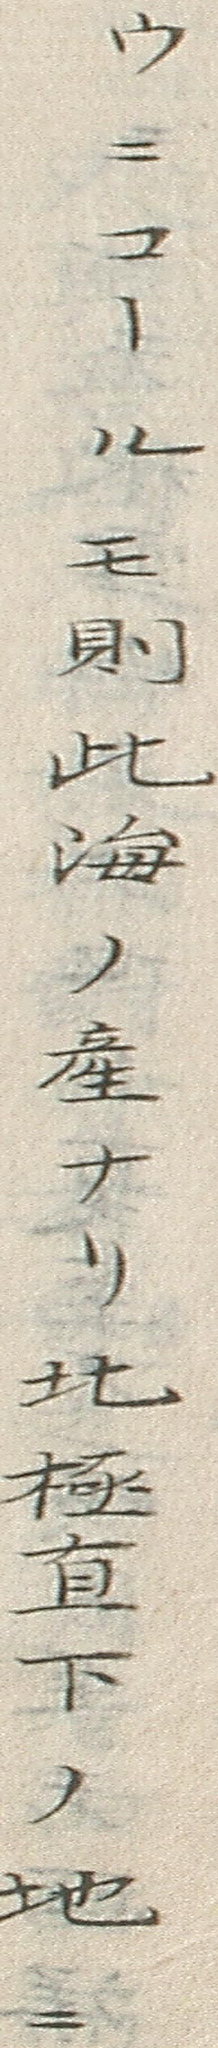ウニコールモ則此海ノ産ナリ北極直下ノ地ニ
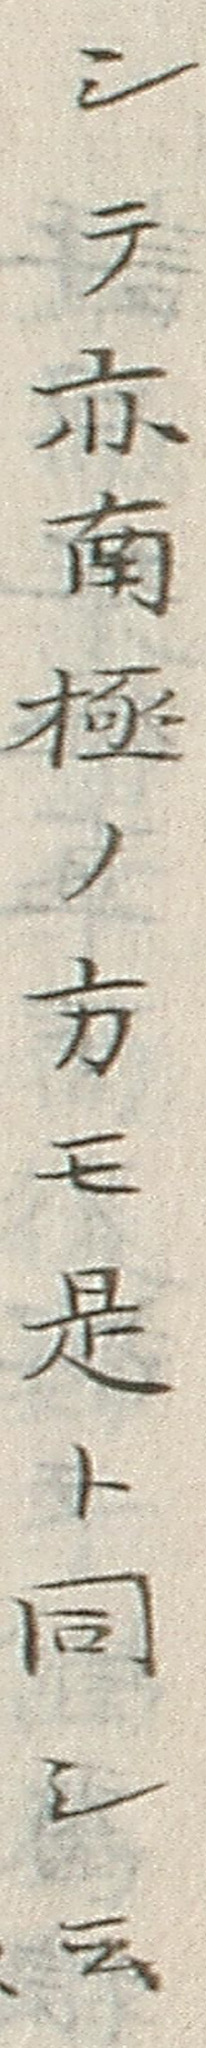シテ亦南極ノ方モ是ト同シ云〻

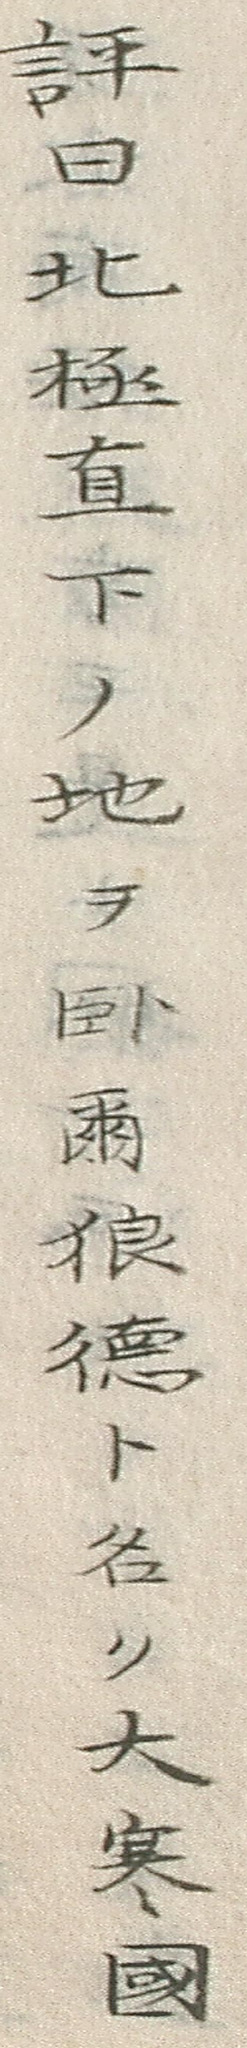評曰北極直下ノ地ヲ臥爾狼徳ト名ク大寒国
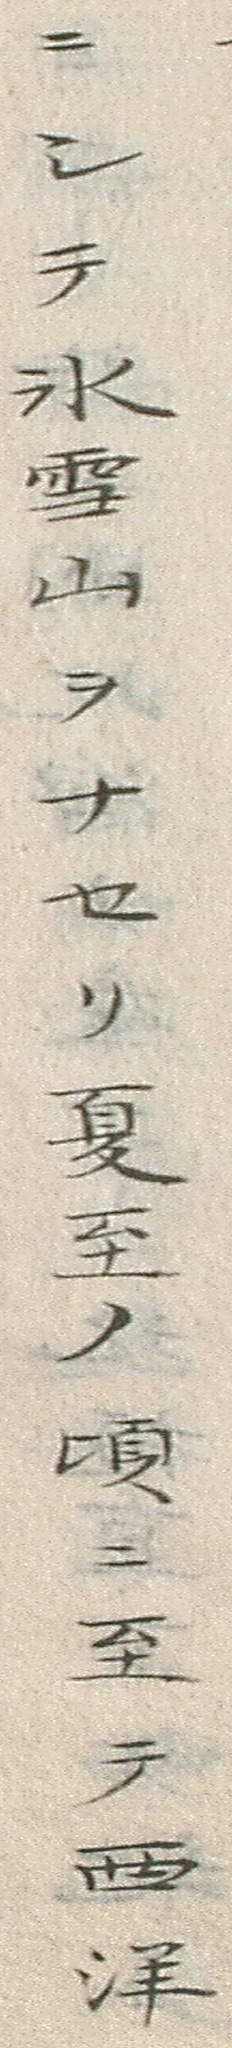ニシテ氷雪山ヲナセリ夏至ノ頃ニ至テ西洋
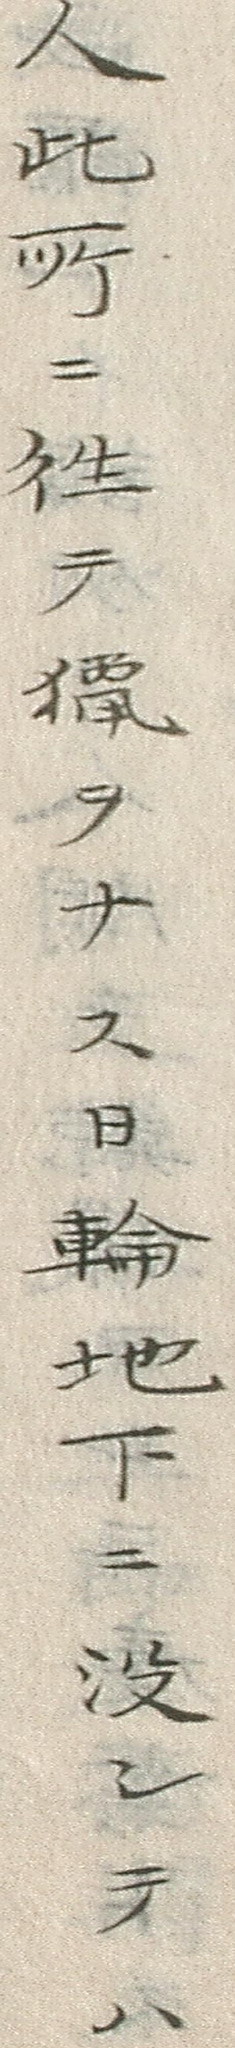人此所ニ往テ獵ヲナス日輪地下ニ没シテハ
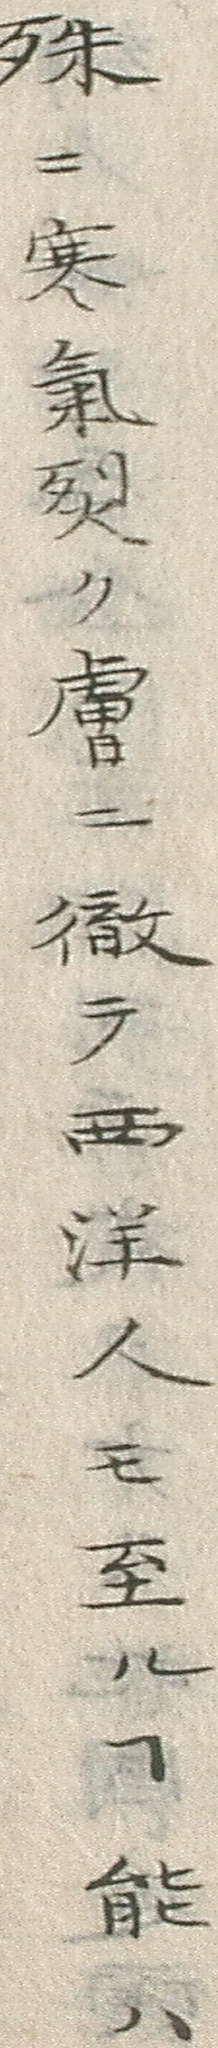殊ニ寒気烈ク膚ニ徹テ西洋人モ至ルコト能ハ
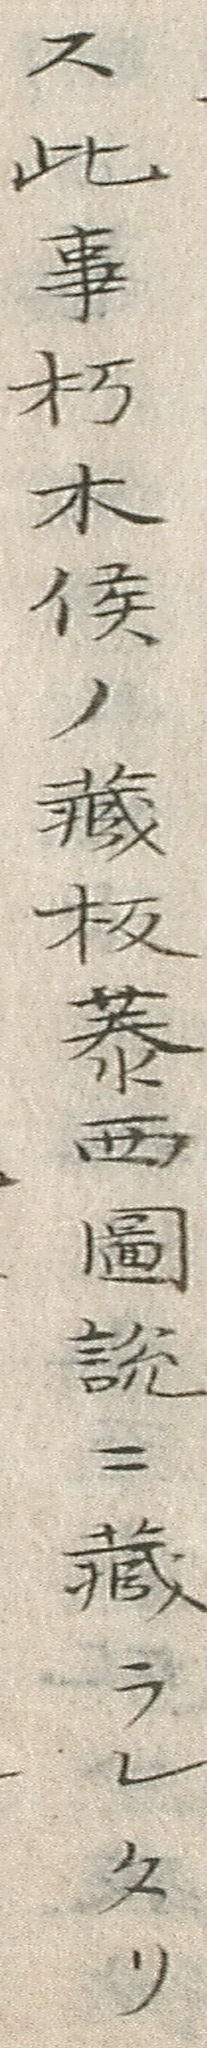ス此事朽木侯ノ蔵板泰西図説ニ蔵ラレタリ
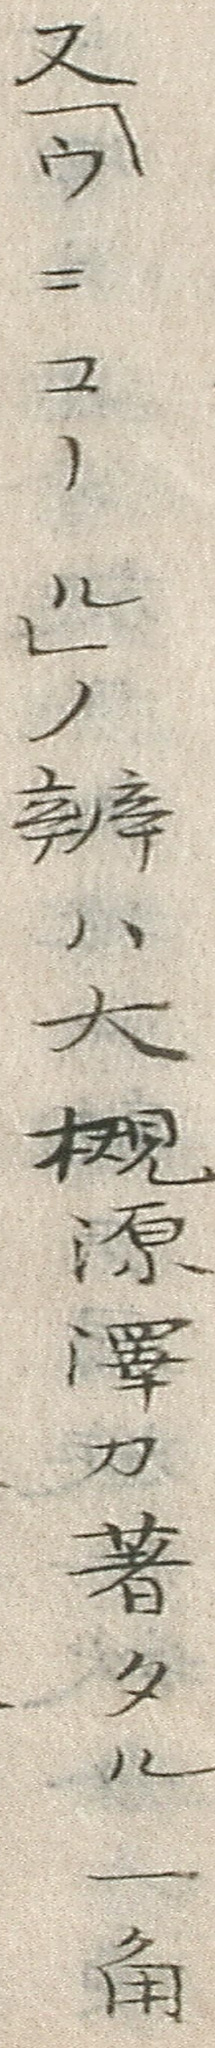又「ウニコール」ノ弁ハ大槻源沢カ著タル一角
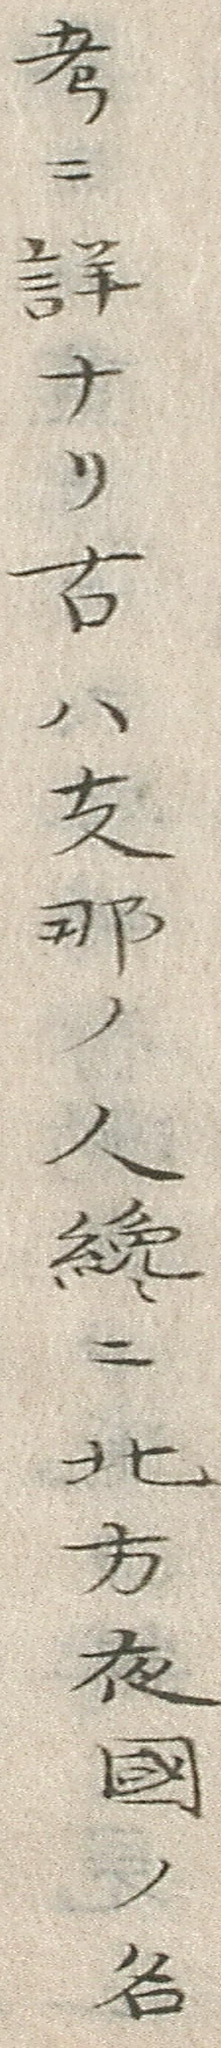考ニ詳ナリ古ハ支那ノ人僅ニ北方夜国ノ名
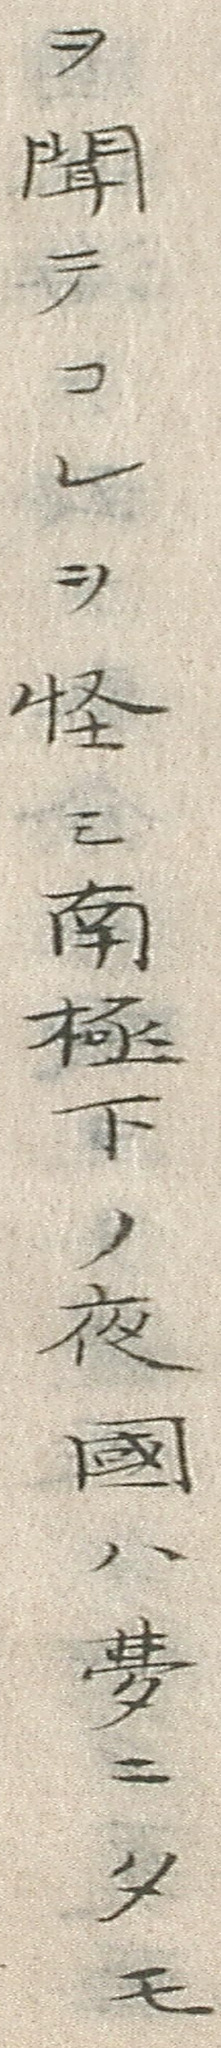ヲ聞テコレヲ怪ミ南極下ノ夜国ハ夢ニタモ
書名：天學略名目羽翼　全
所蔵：東京大学地震研究所図書室 Earthquake Research Institute Library, The University of Tokyo, JAPAN
